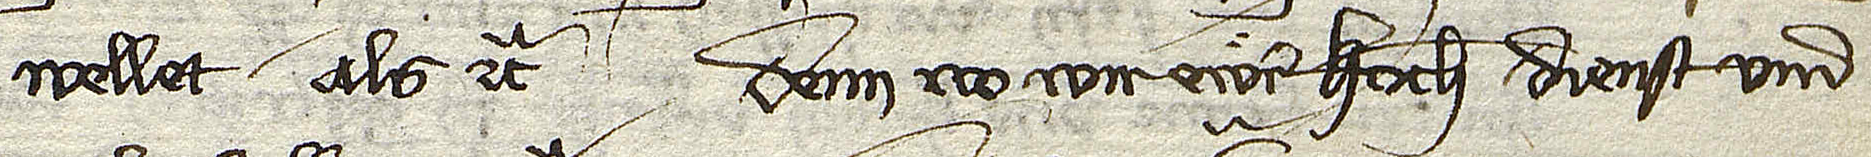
wellet / als ec* Denn wo wir ew*r hoch* / dienſt vnd
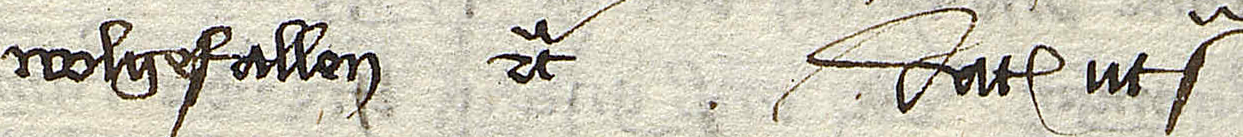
wolgefallen ec* / Dat* ut ſ*
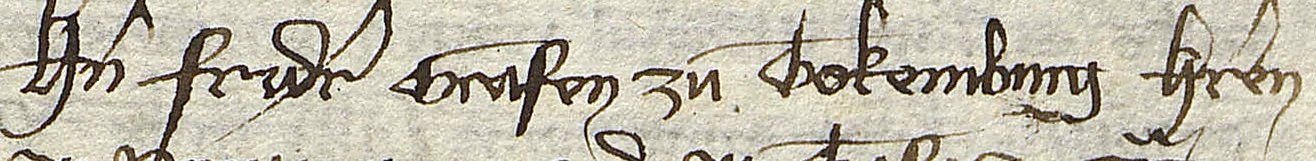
H*n fridr* Grafen ʒu Tokemburg H*ren
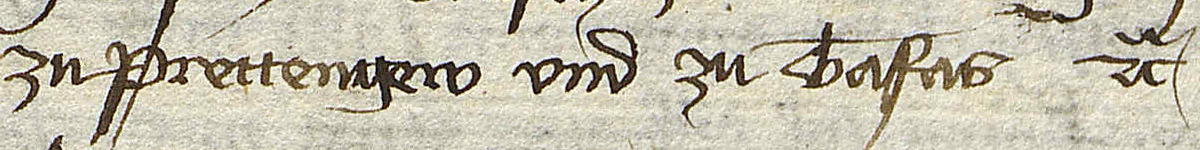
ʒu Prettengew vnd ʒu Tafas ec*
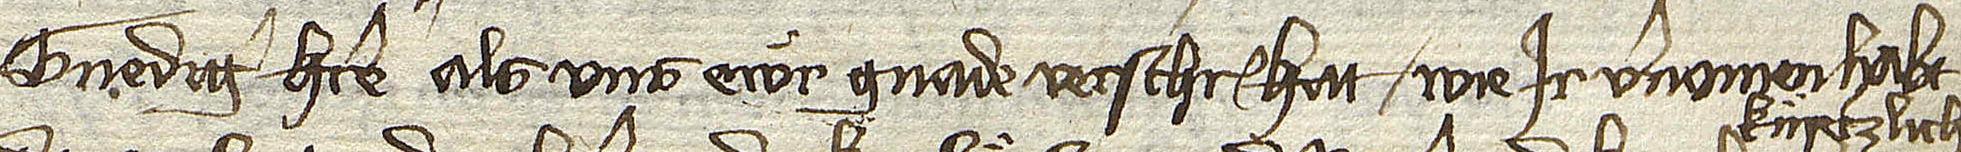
Gnedig* h*re als vns ewr gnade verſchr* hat / wie Ir v*nomen habt
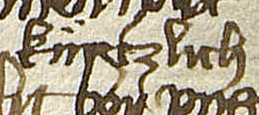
kürcʒlich
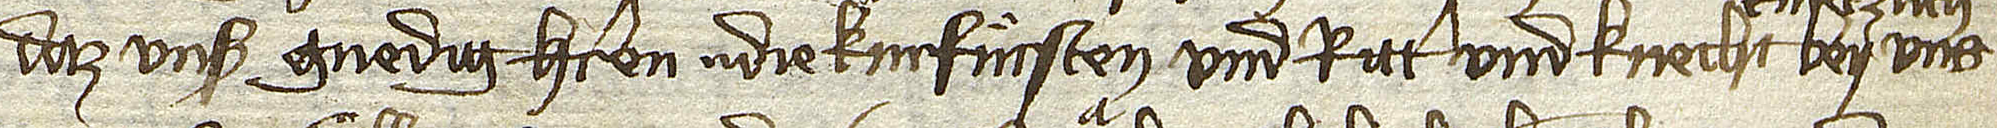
daʒ vnſ* gnedig h*ren ~ die kurfürſten vnd Ritt* vnd knecht bey vns
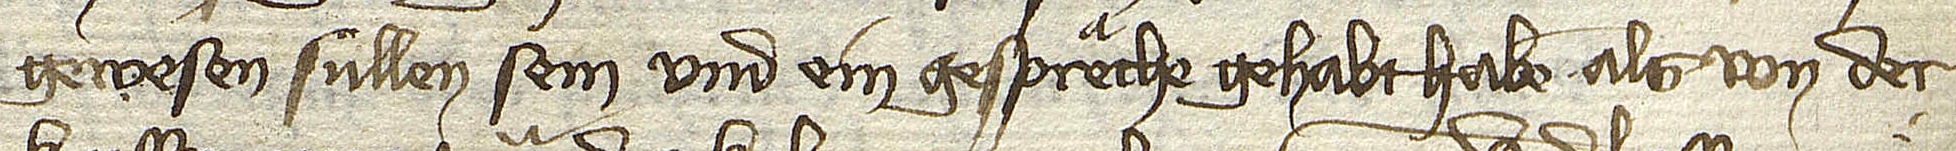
geweſen ſüllen ſein vnd ein geſprëche gehabt habe* . als von der
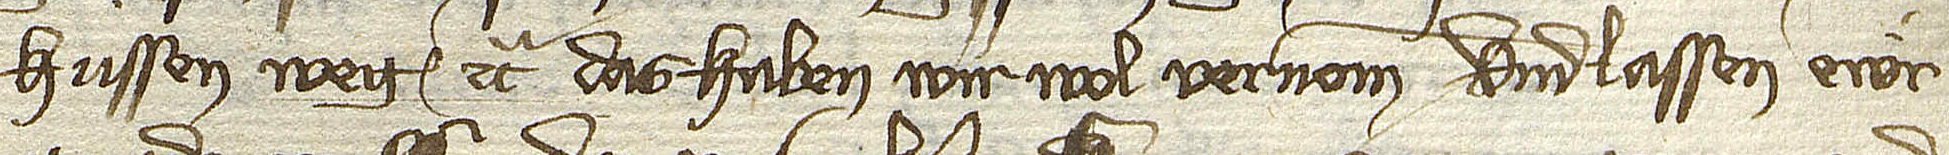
huſſen weg* ec* das haben wir wol vernom* / Vnd laſſen ewr
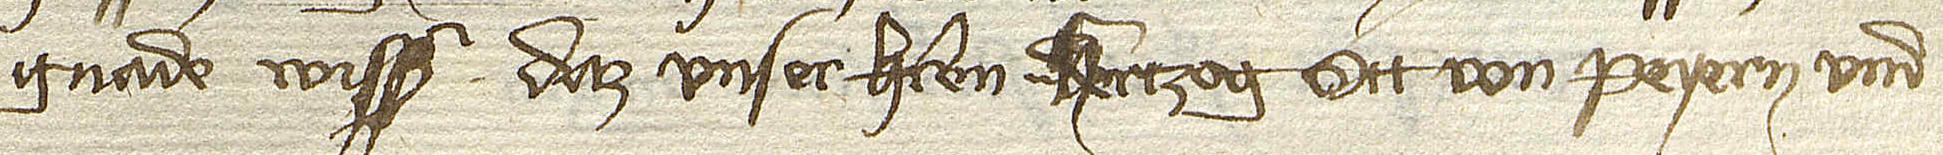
gnade wiſſ* . daʒ vnſer h*ren Hercʒog Ott von Peyern vnd
